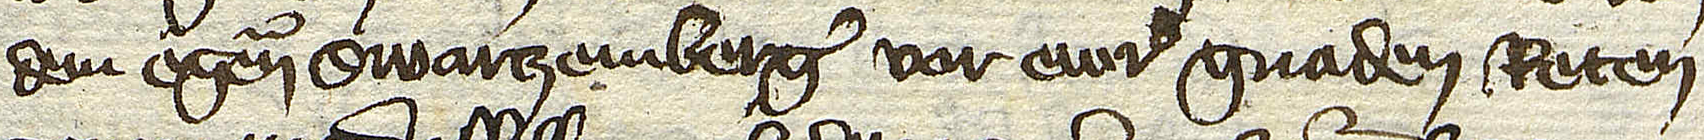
dem egen* Swarcʒemberg* vor ewr* gnaden Reten
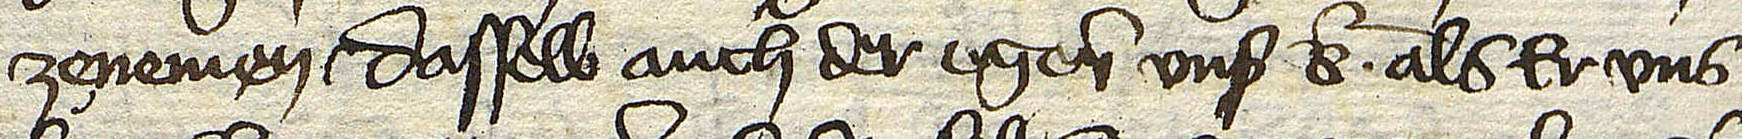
ʒenemen / Daſſelb auch der egen* vnſ* B* . als Er vns
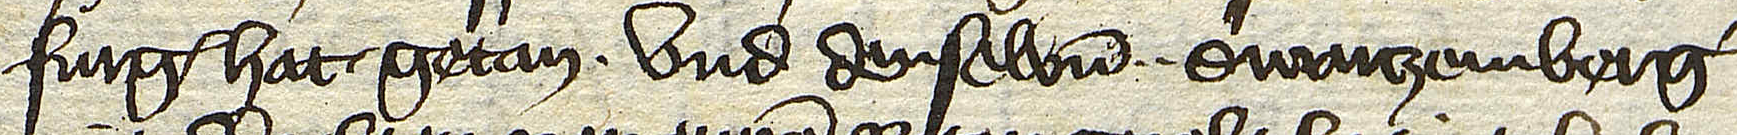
fürg* hat / getan . Vnd denſelb*n ~ Swarcʒemberg*
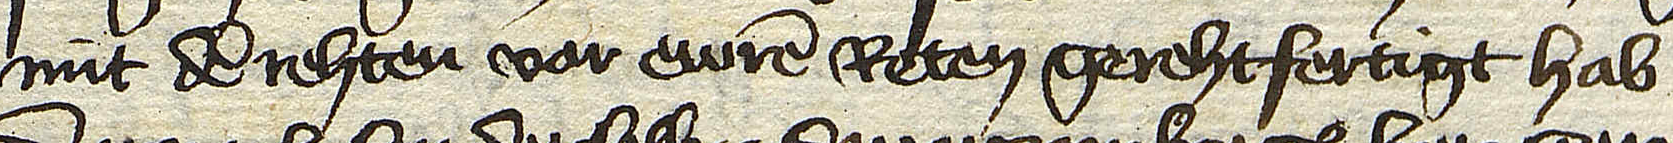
mit de* rehten vor ewre* Reten gerehtfertigt hab
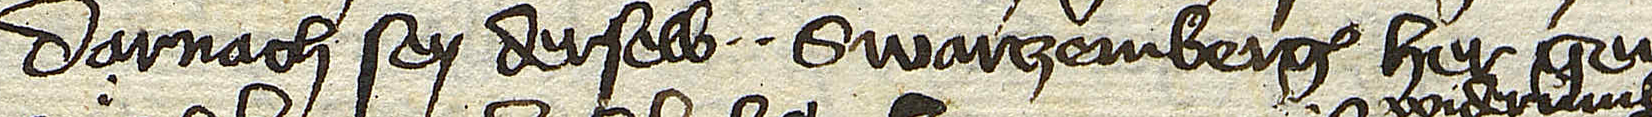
Darnach ſey derſelb* ~ Swarcʒemberg* her gen
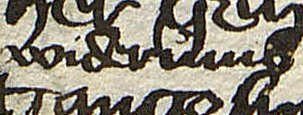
widerümb
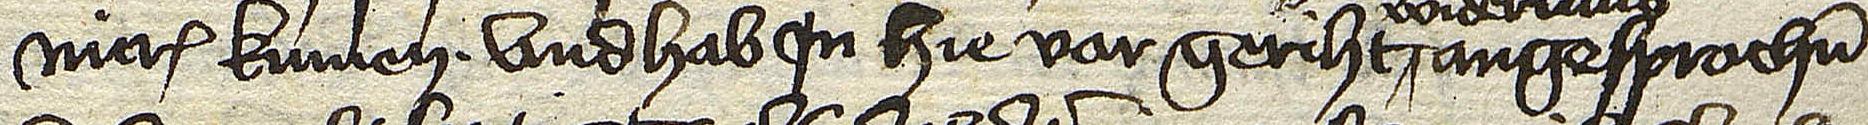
Nür* kumen . vnd hab In hie vor geriht angeſproch*n
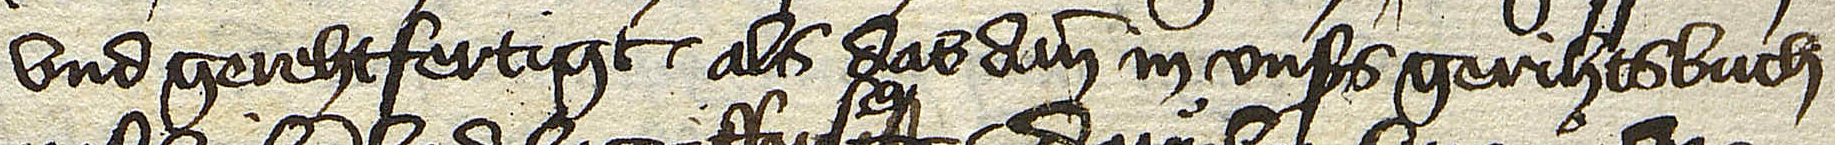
Vnd gerehtfertigt / als das dan* in vnſ*s gerihtsbuch
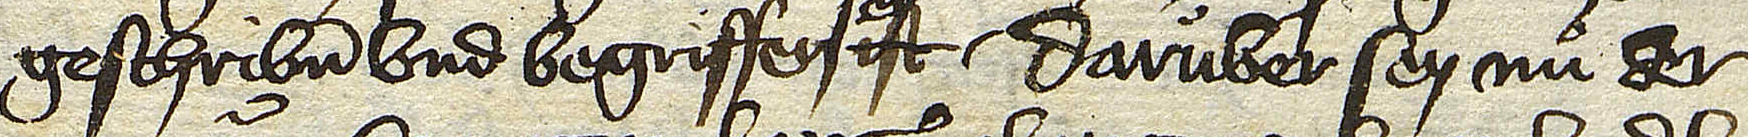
geſchrib*n vnd begriffen iſt / Darüber ſey nü der
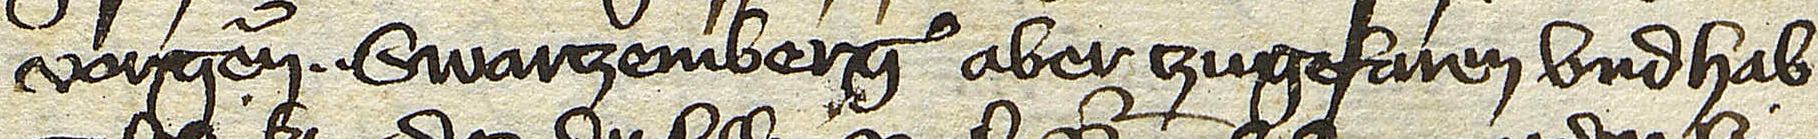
vorgen* ~ Swarʒcemberg* aber ʒugefaren vnd hab
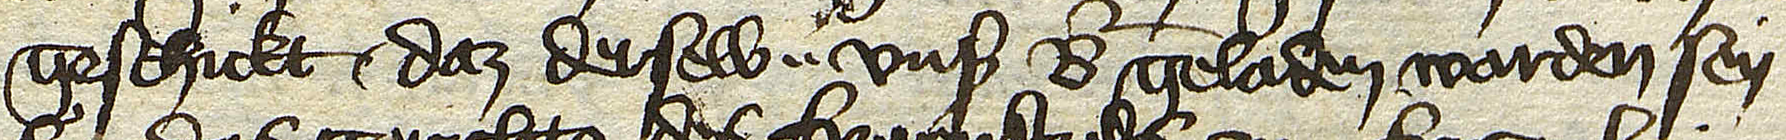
geſchickt* / daʒ derſelb ~ vnſ* B* geladen worden ſey
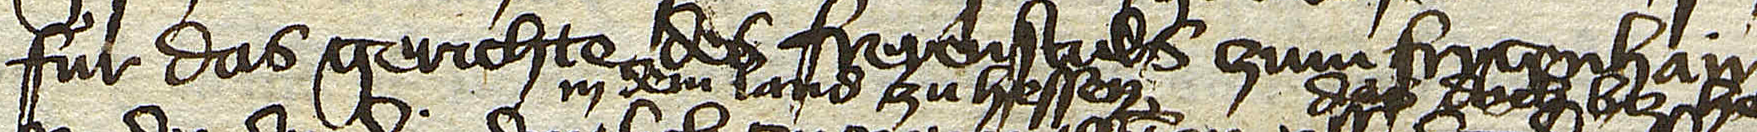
für das gerichte des freyenſtuls cʒum frygenhain
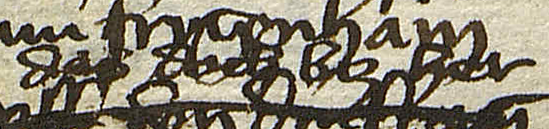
das doch biʒ her
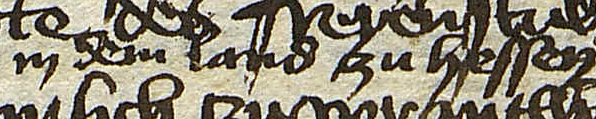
in dem land cʒu heſſen
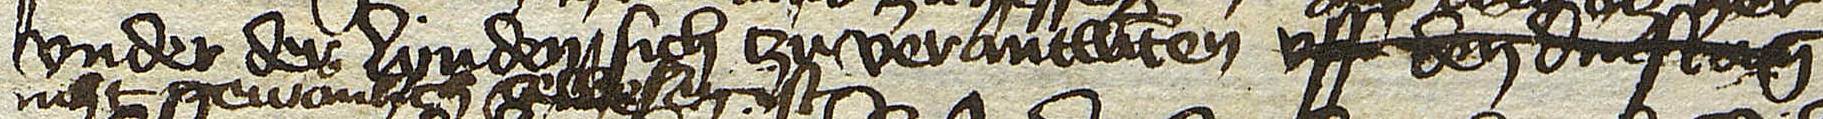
vnder der lynden ſich cʒu verantwten* vff den dienſtag
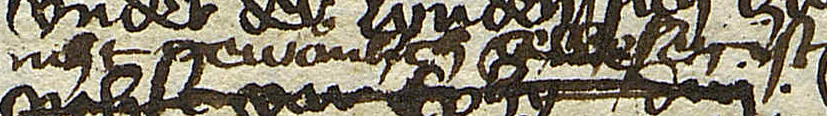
niht gewönlich geweſen iſt
